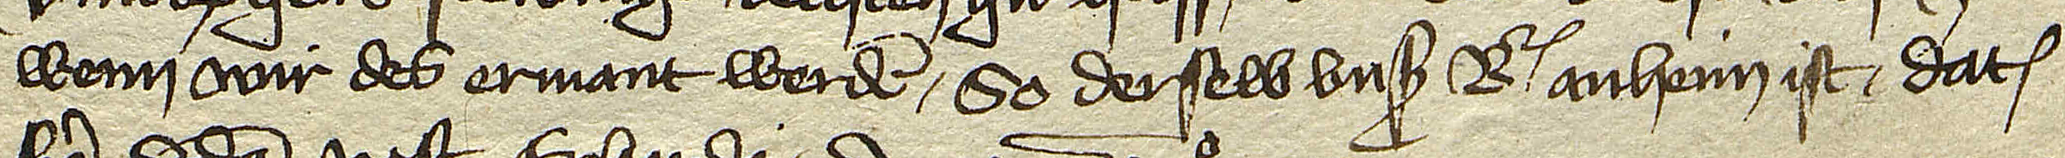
wenn wir des ermant werde* / So derſelb vnſ* B* anheim iſt / dat*
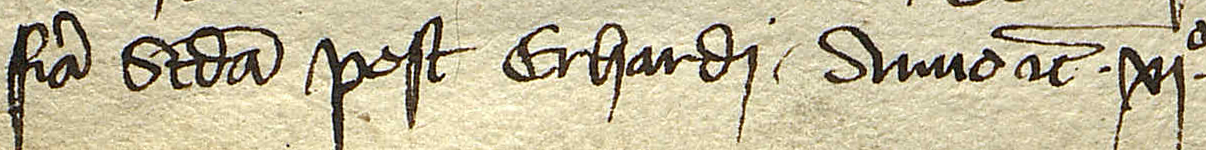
fia* Scda* poſt Erhardi / Anno ec* . xi* .
